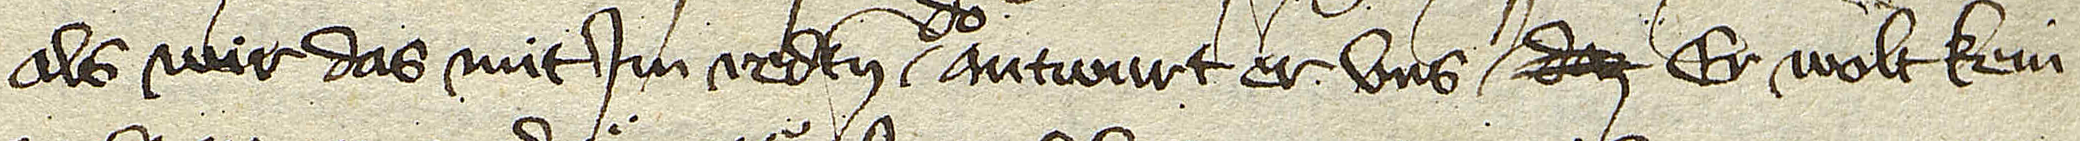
als wir das mit Im redtn* / antwurt er vns / daʒ Er wolt kein
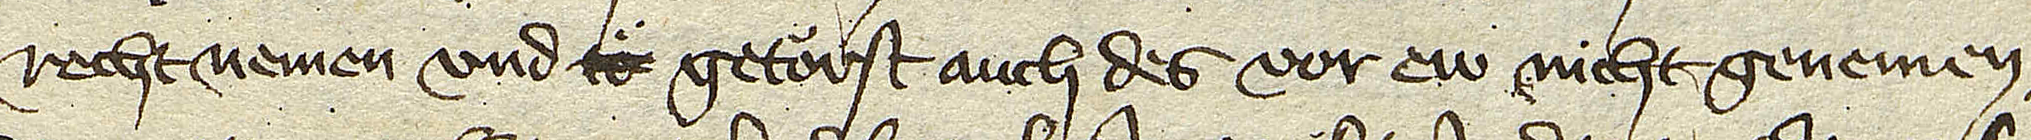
recht nemen vnd tö getörſt auch des vor ew nicht genemen
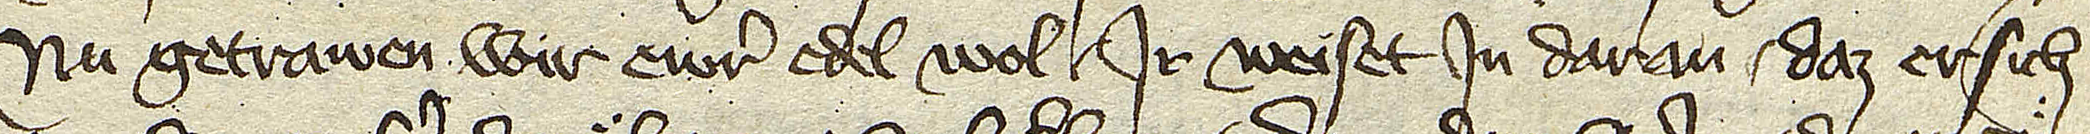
Nu getrawen wir ewr* edel wol / Ir weiſet In daran / daʒ er ſich
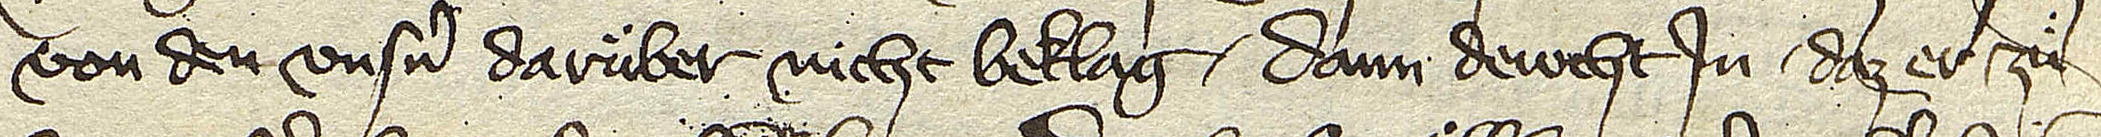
von den vnſn* darüber nicht beklag / dann dewcht In / daʒ er cʒü
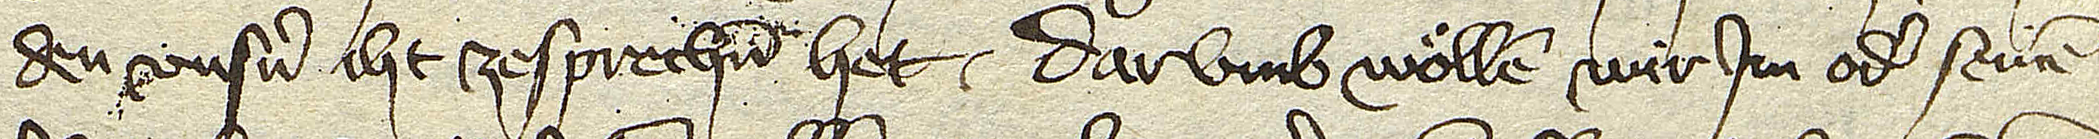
den vnſn* iht cʒeſprechn* het / Darvmb wölle* wir Im od* ſeine*
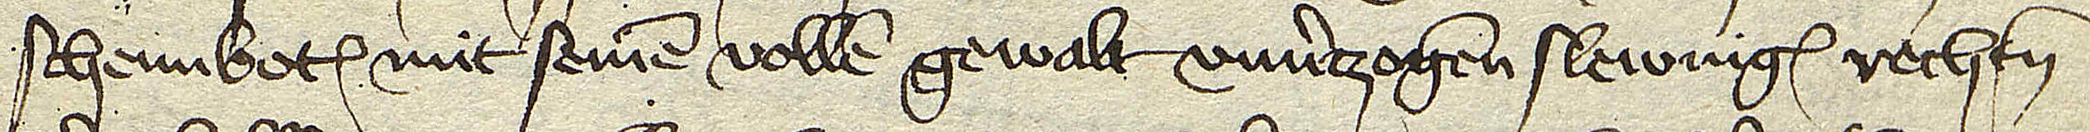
ſcheimbot* mit ſeine* volle* gewalt vnu*cʒogen* ſlewnig* rechtn*
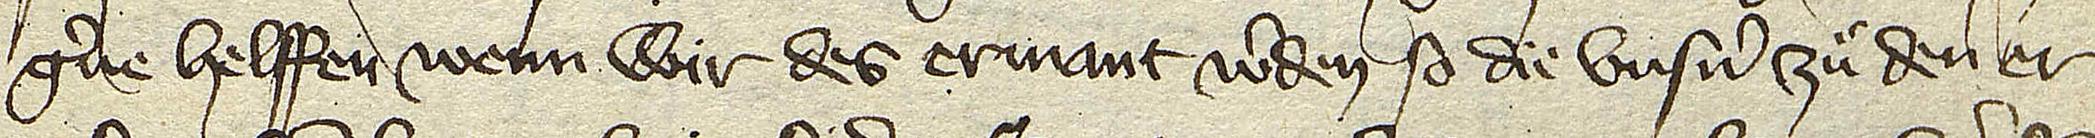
g*ne helffen wenn wir des ermant w*den ſo die vnſn* cʒü den er
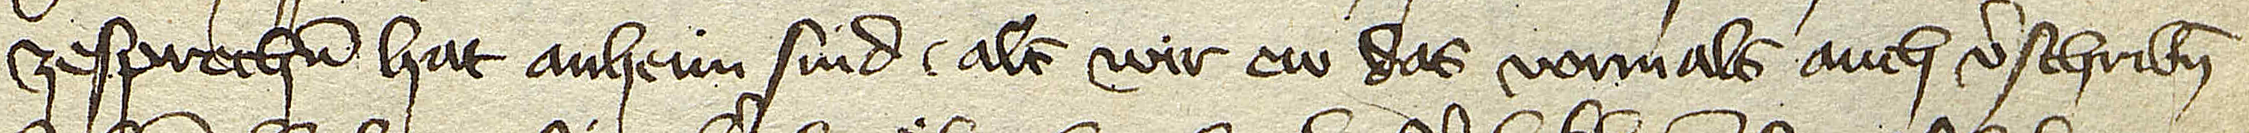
cʒeſprechn* hat anheim ſind / als wir ew das vormals auch v*ſchribn*
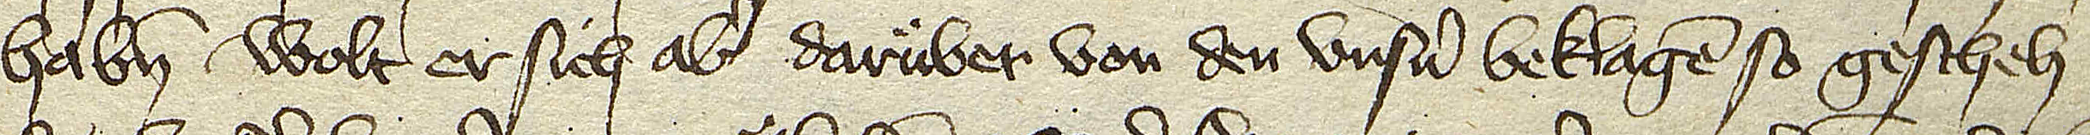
habn* / wolt er ſich ab* darüber von den vnſn* beklage* ſo geſcheh
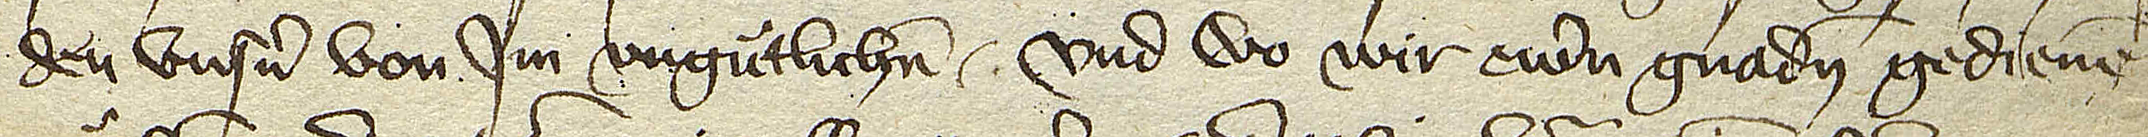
den vnſn* von Im vngütlichn* / vnd wo wir ew*n gnadn* gediene*
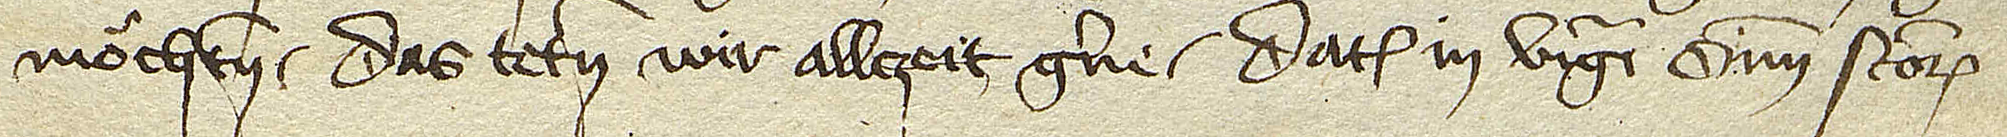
möchtn* / Das tetn* wir allcʒeit g*ne / Dat* in vigi* Omi* ſco*
